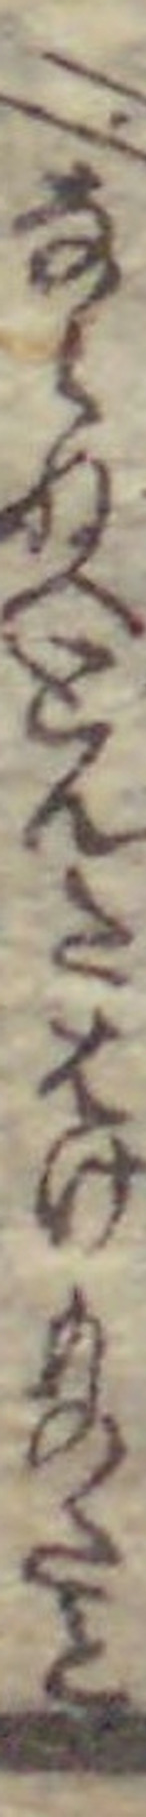ならねへとんたはけものたと
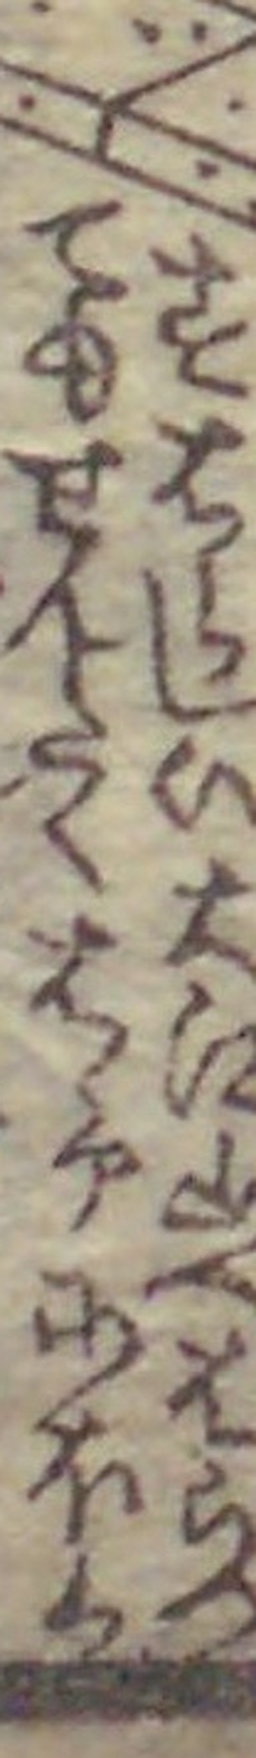てもせんたくはゝァにほか
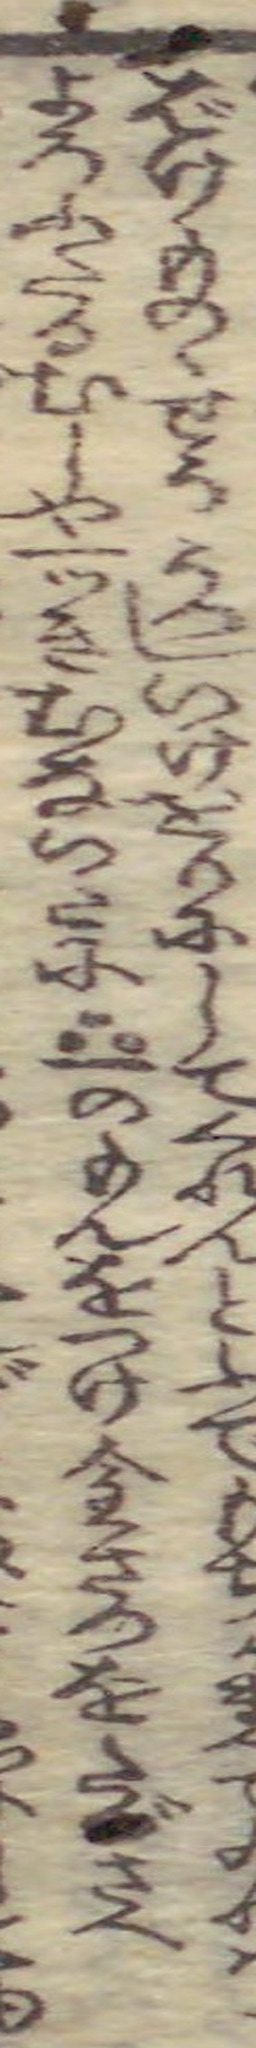よろふたるむしや一つきむないたに∴一のもんをつけ金さつをたづさへ
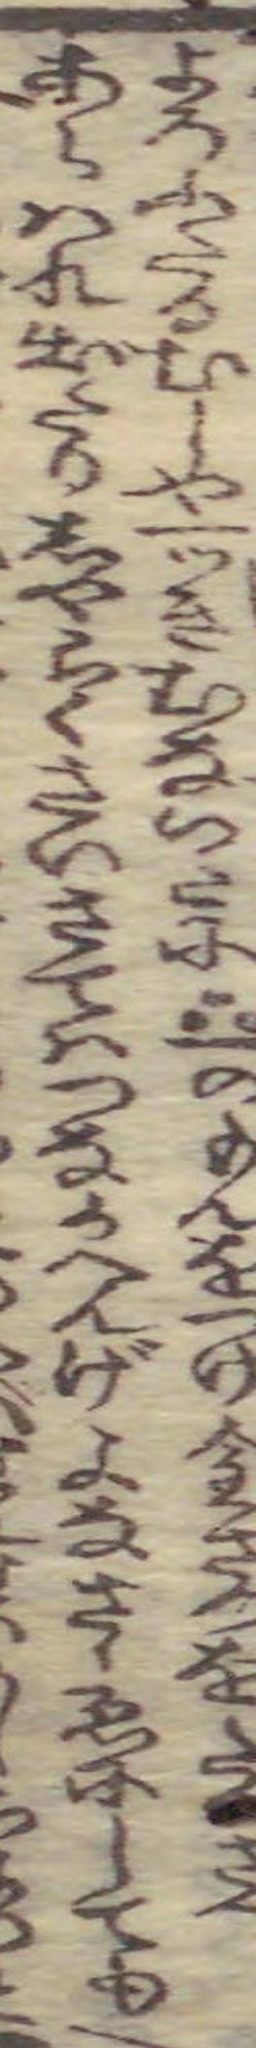あらはれ出たりしやらくさいさてはつなかへんげよなさゝゑにしても
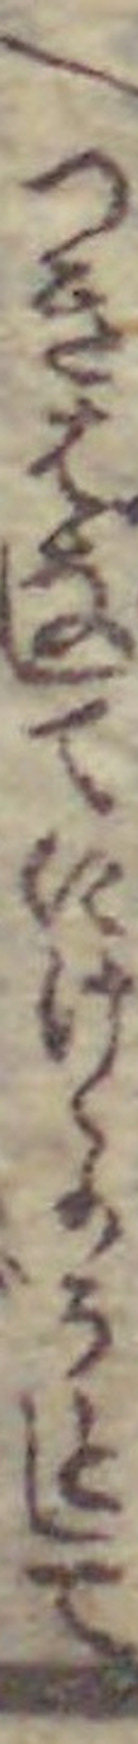つきはなしてにけようとして
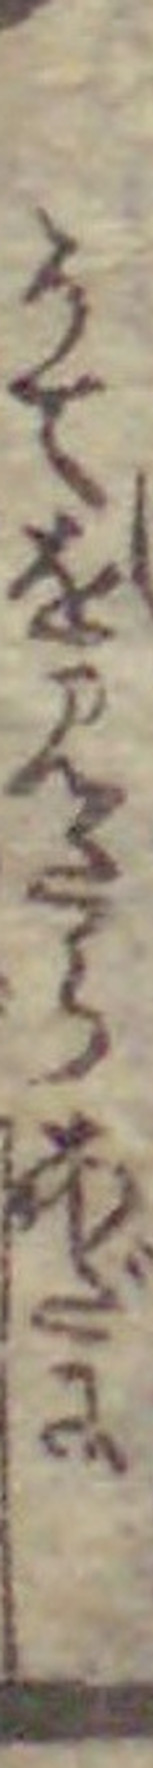うてを見たらあだに
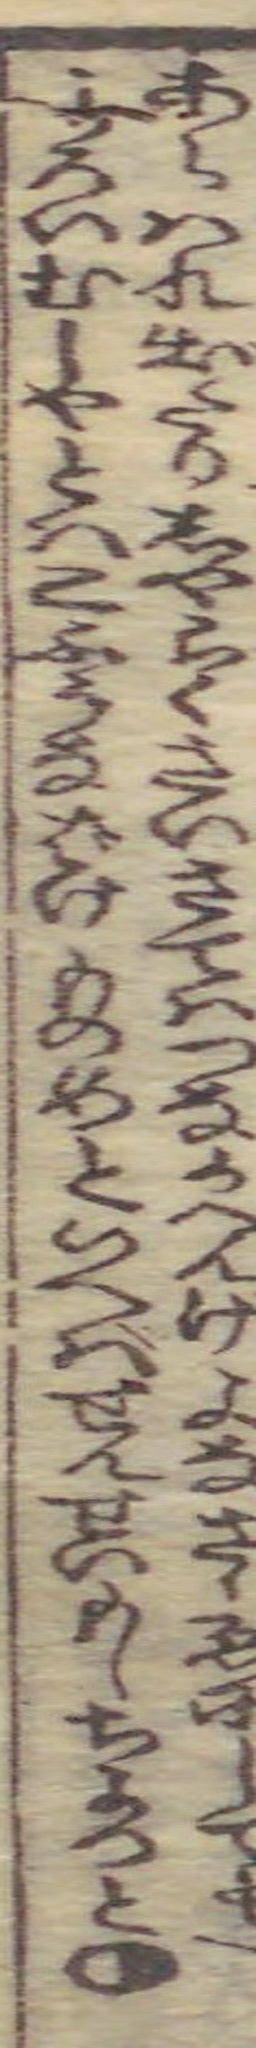よろいむしやとはこふうなばけものめといへばせんせいもしちよつと●
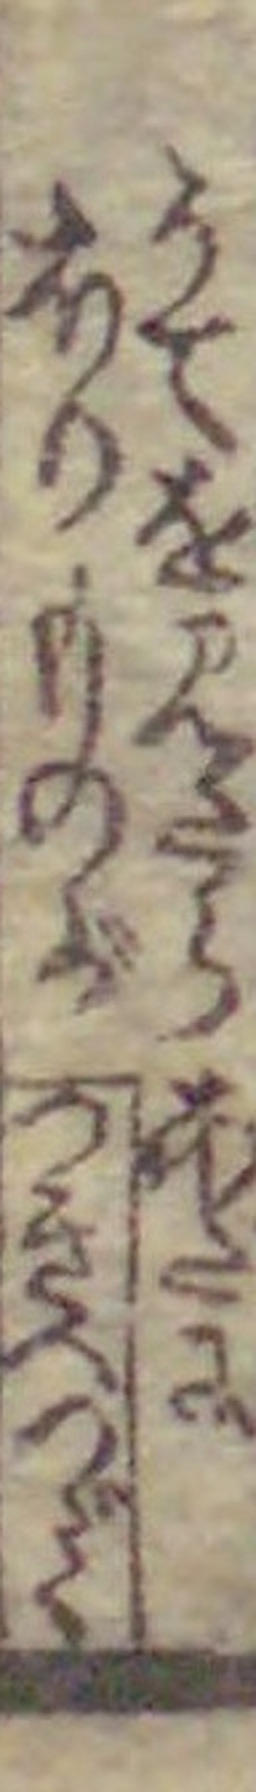ほりものがつきへつゞく

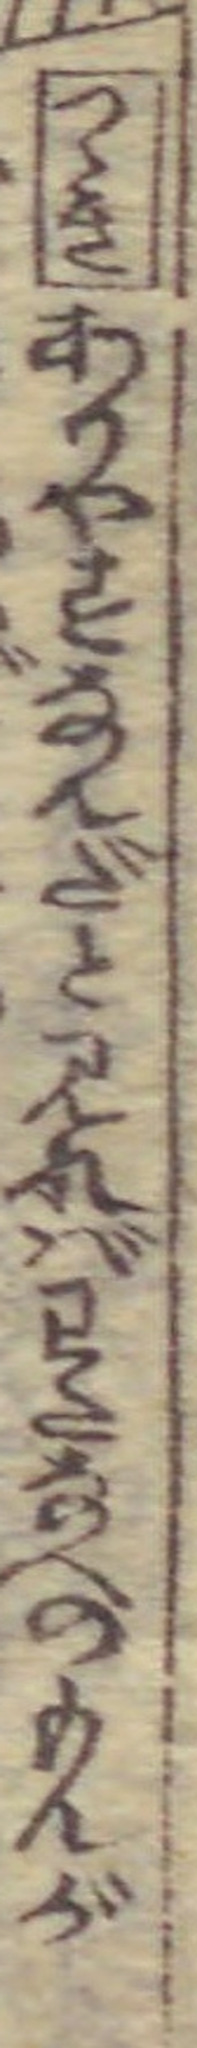つゝきありやすなんだと見ればわたなへのもんが
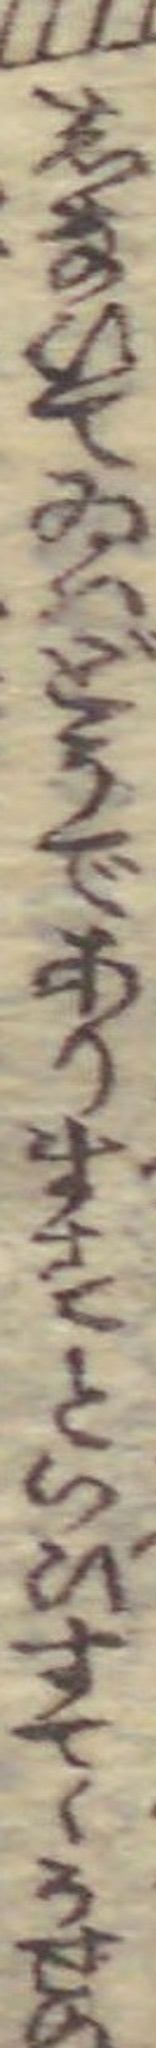しなひてゐはどうでありますといひすてゝうせぬ
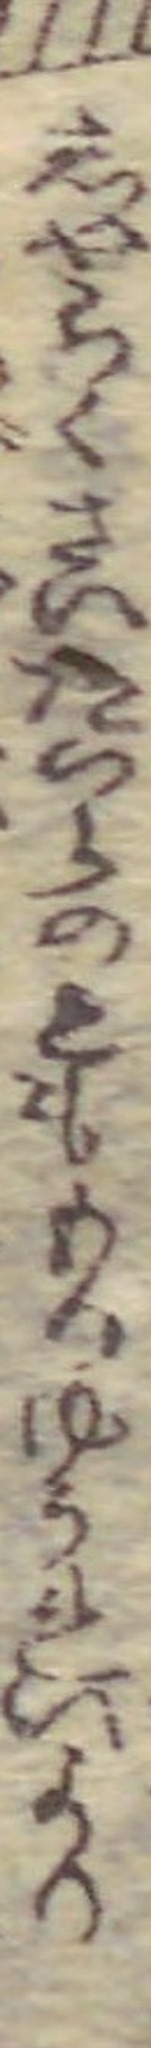しやらくさいたいらのとももりゆうれいより
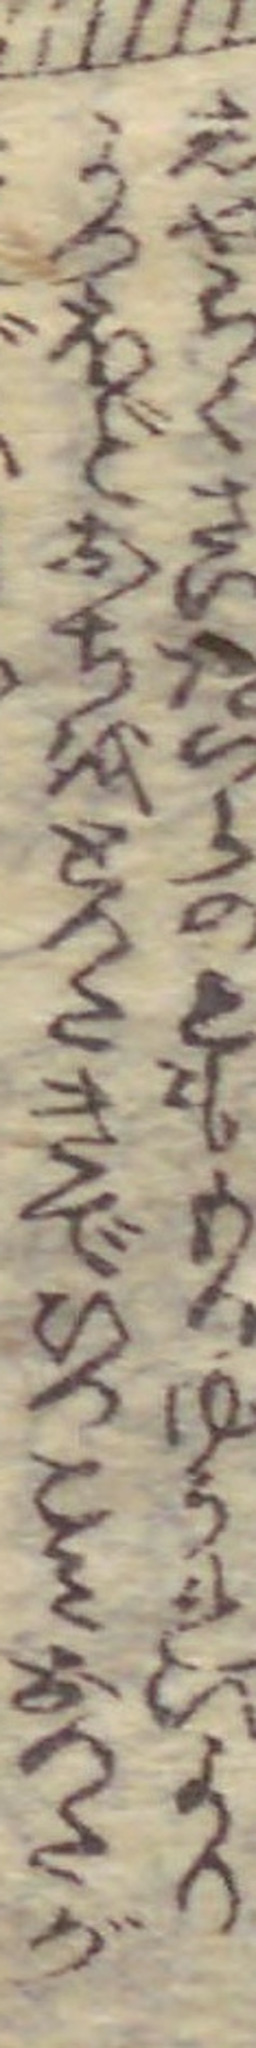よつほどおちをとつたきでひつこみおつたが
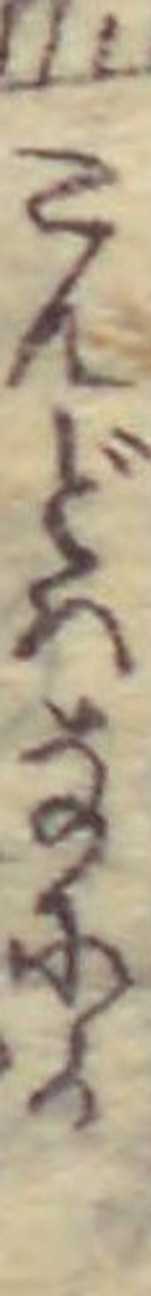こんどはなにか
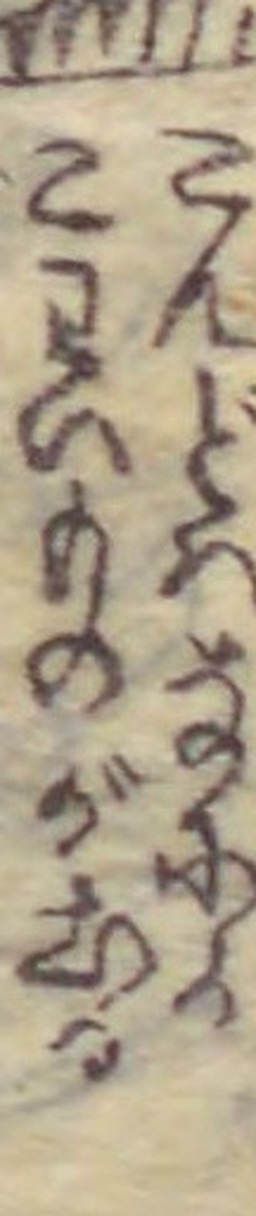こわいものが出る
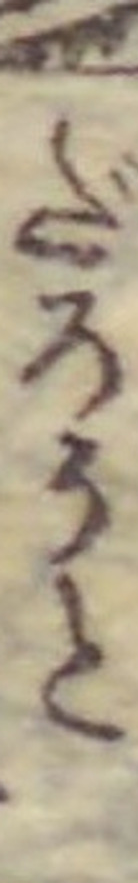だろうと
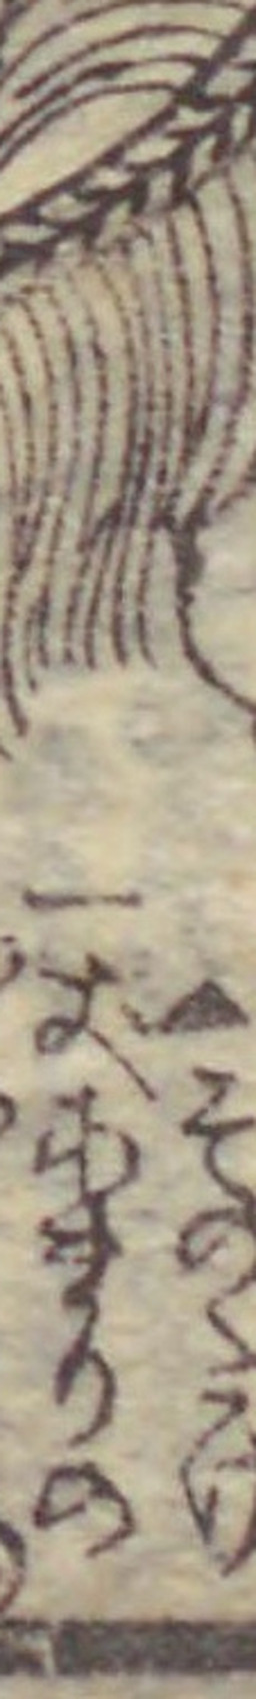一丈あまりの
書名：大時代唐土化物 3巻. 曽我太夫染
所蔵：国立国会図書館 National Diet Library, JAPAN
